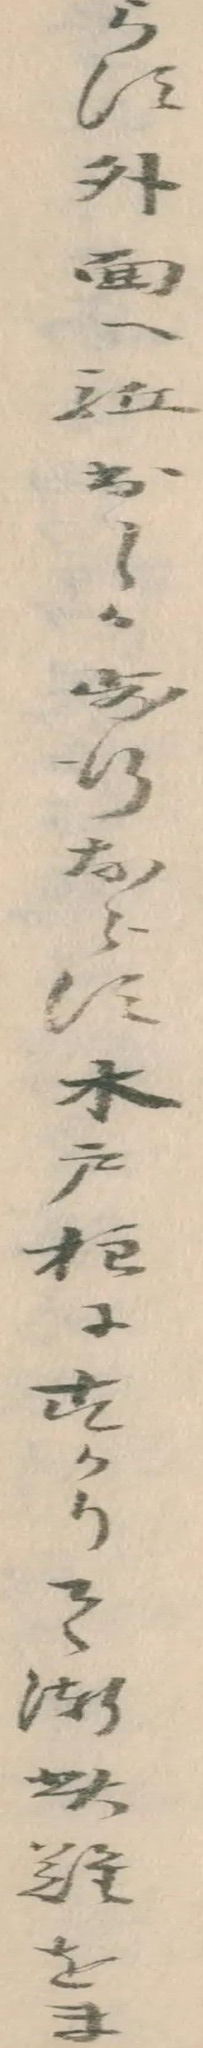らす外面へ駆出しか歩行ならす木戸柱にすかりて漸此難をま

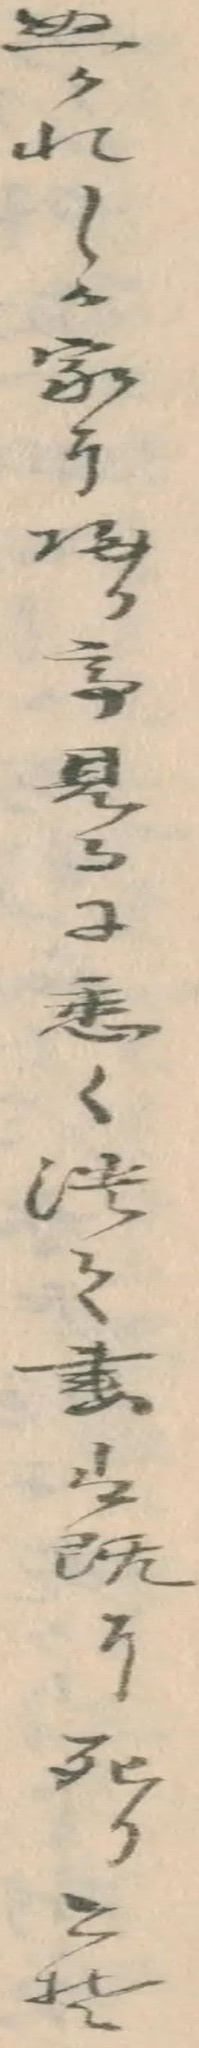ぬかれしか家に帰りて見るに悉く潰て妻は既に死りとそ
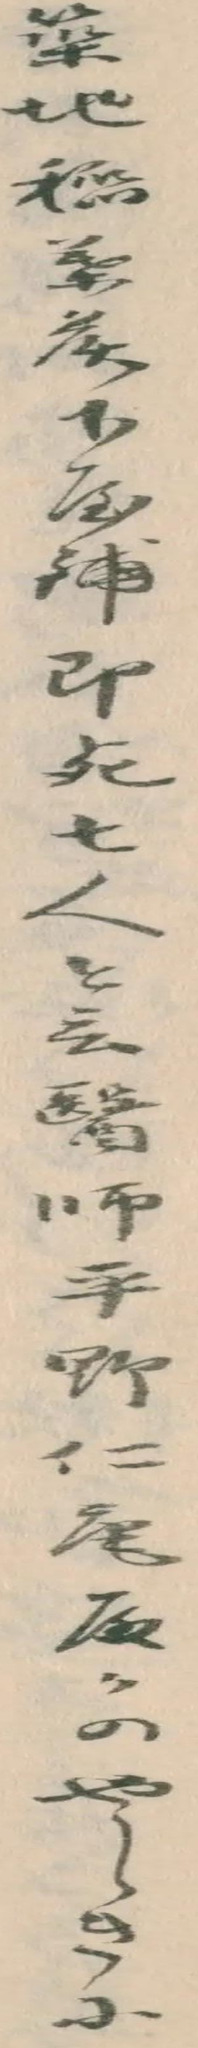築地稲葉侯下屋鋪即死七人と云医師平野仁庵殿かのやしきに
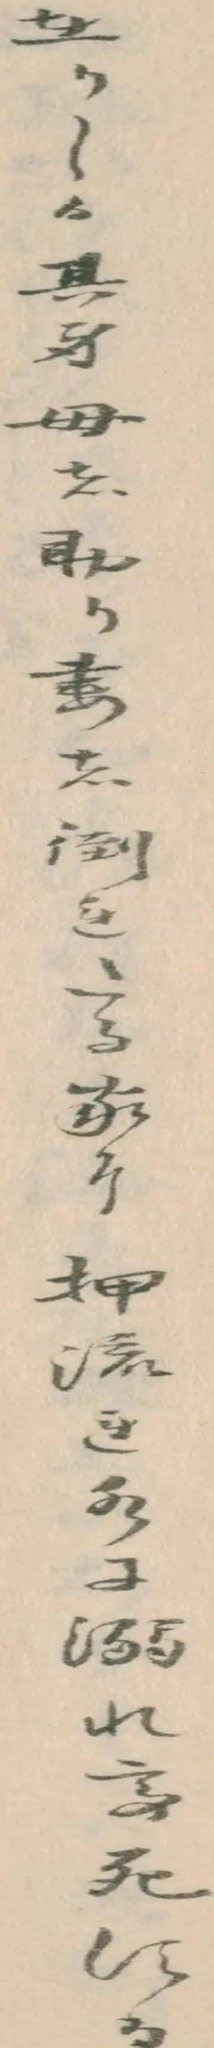在りしか其身母は助り妻は倒れたる家に押流れ水に溺れて死する
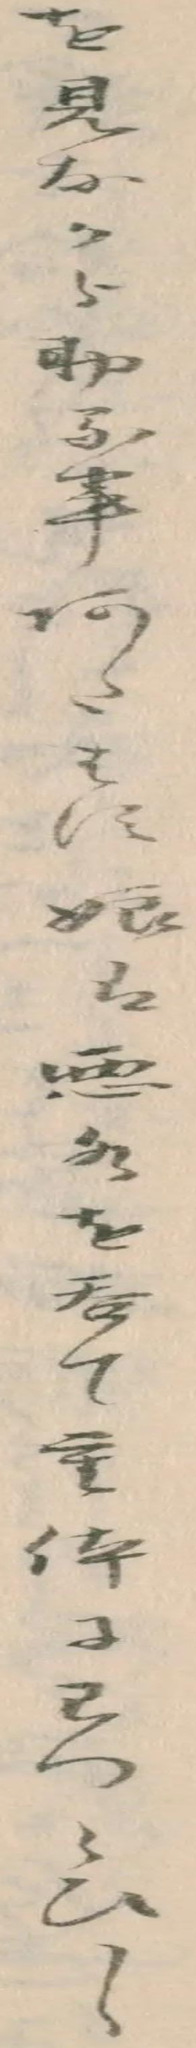を見なから助る事あたはす娘は悪水を吞て重体にわつらひし
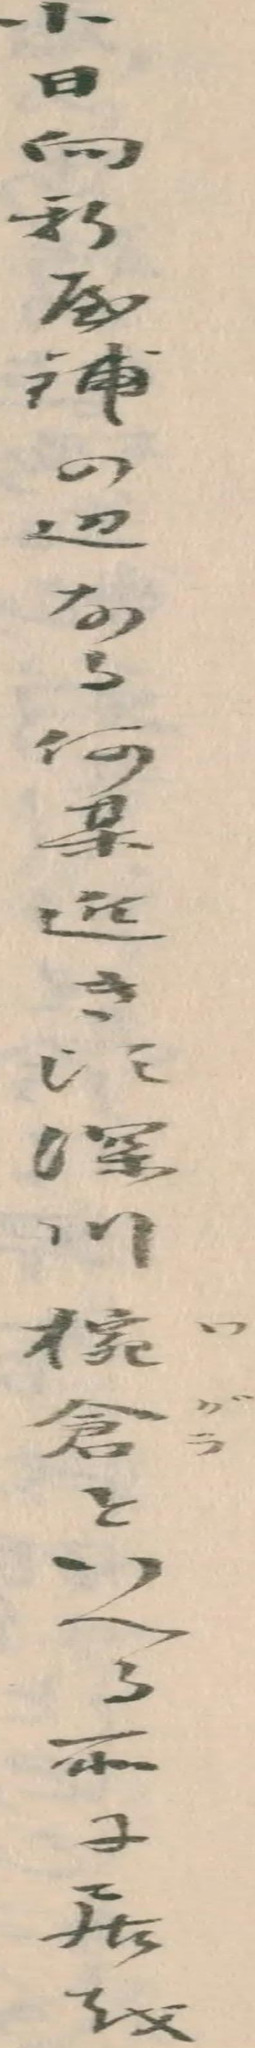小日向新屋鋪の辺なる何某近き頃深川碗倉といへる所に居を
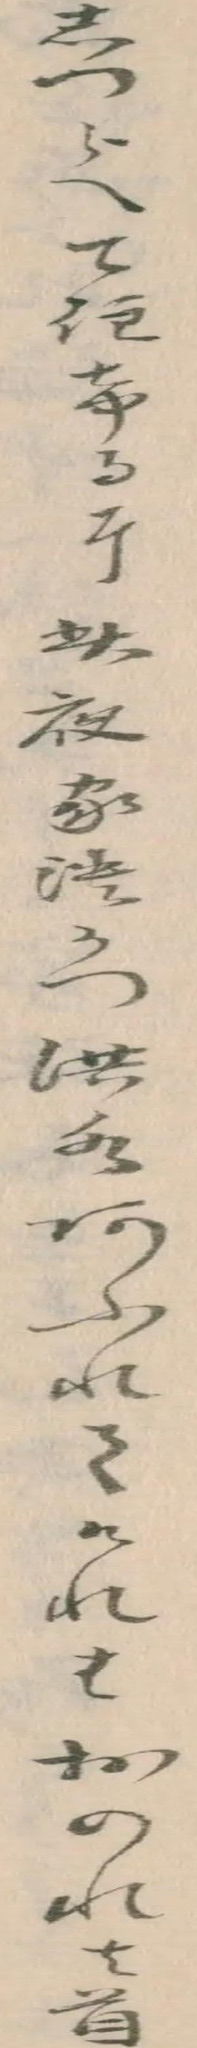しつらへて住けるに此夜家潰かつ洪水あふれてけれはおのれは首
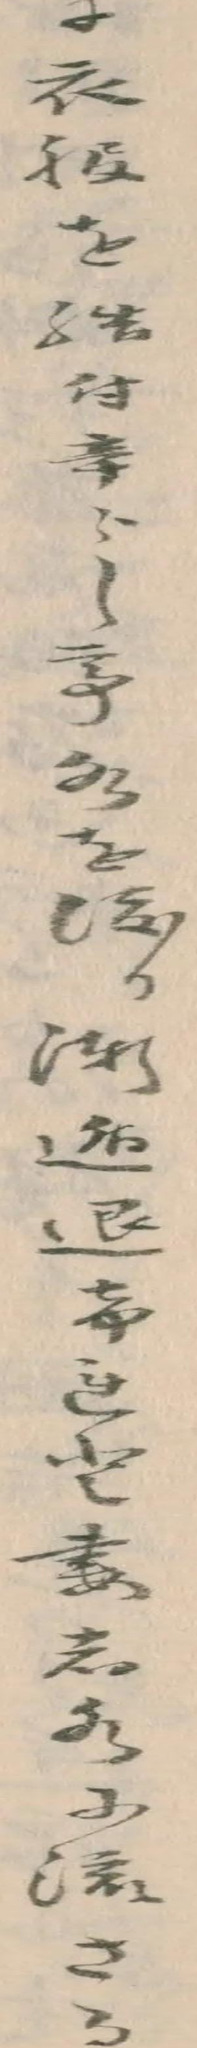に衣服を結付辛うして水を渡り漸遁退けれと妻は水に流さる
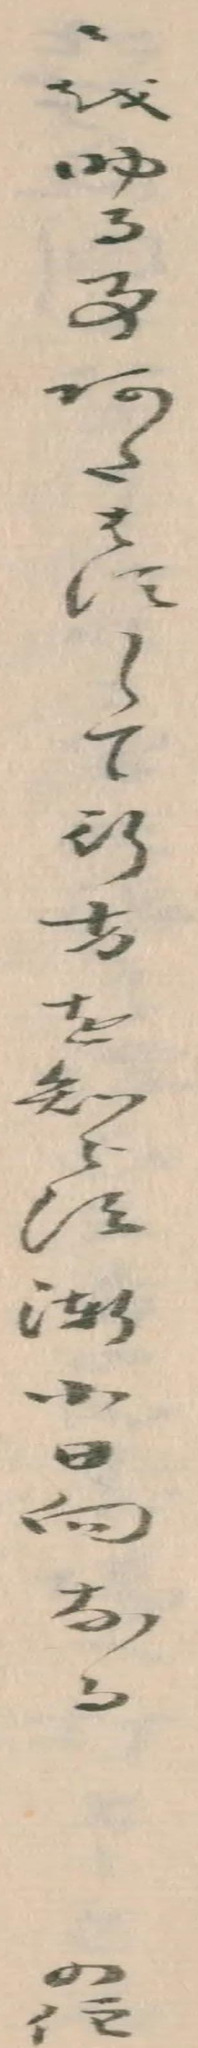ゝを助る事あたはすして行方を知らす漸小日向なるの住
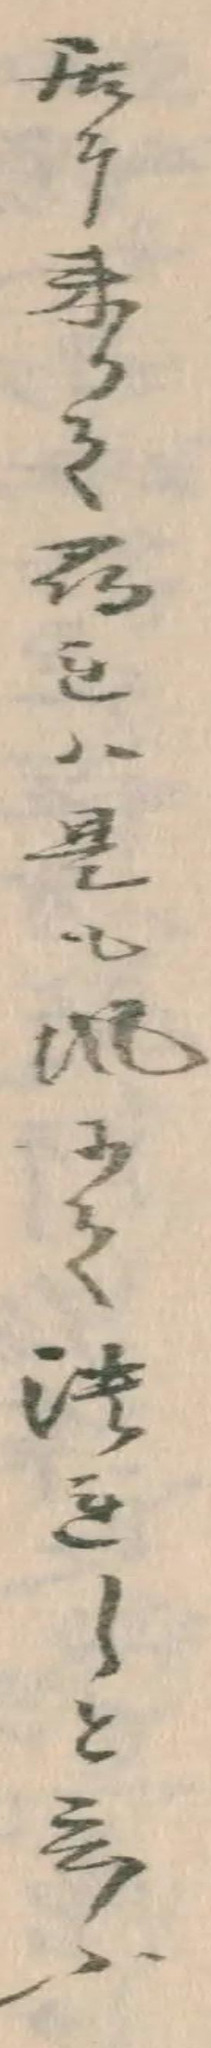居に来りて尋れは是も風にて潰れしと云ふ
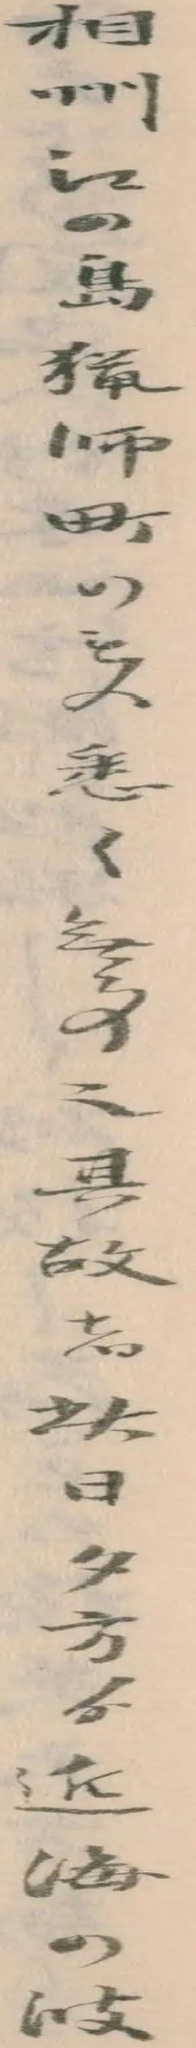相州江の島猟師町のもの悉く無事也其故は此日夕方ゟ近海の波
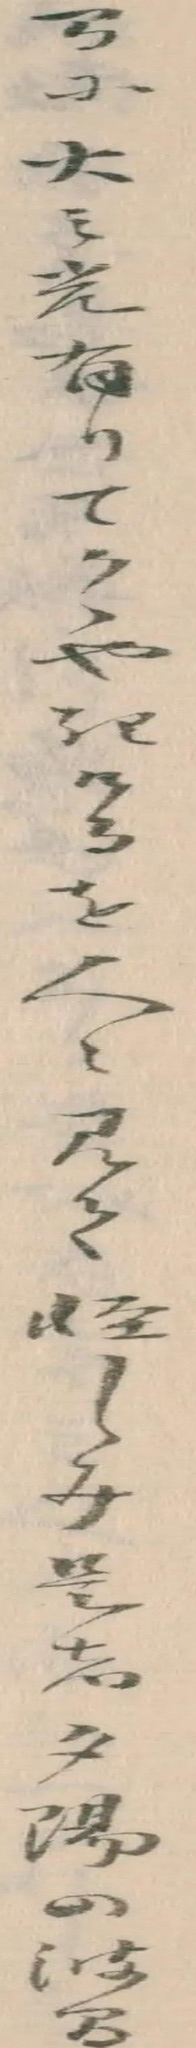間に火之光有りてかゝやきけるを人々見て怪しみ是は夕陽の波間
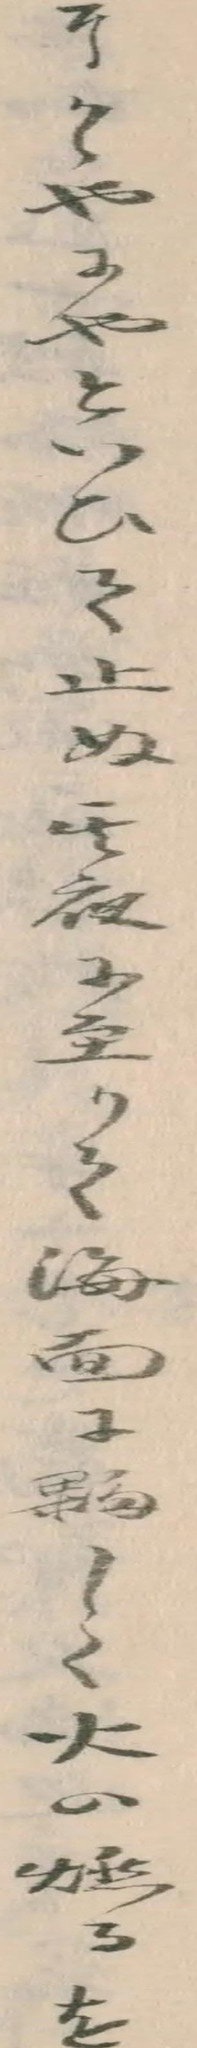にかゝやにやといひて止ぬ其夜に至りて海面に夥しく火の燃るを
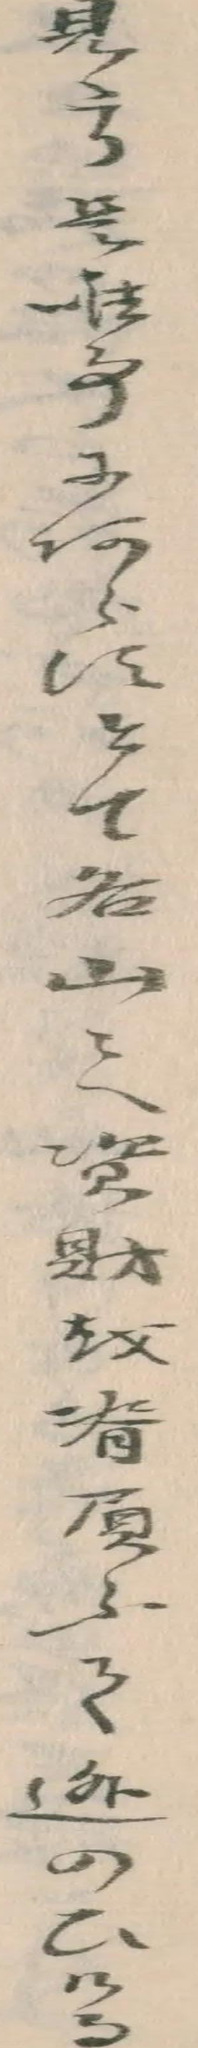見たり是唯事にあらすとて各山々へ資財を背負ふて逃のひける
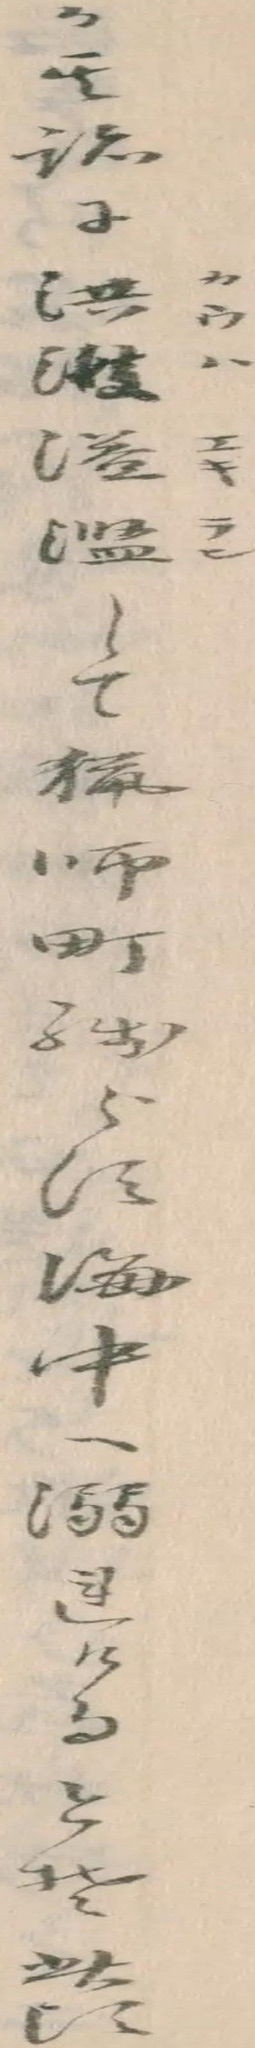か其跡に洪波溢濫して猟師町残らす海中へ溺れけるとそ此頃
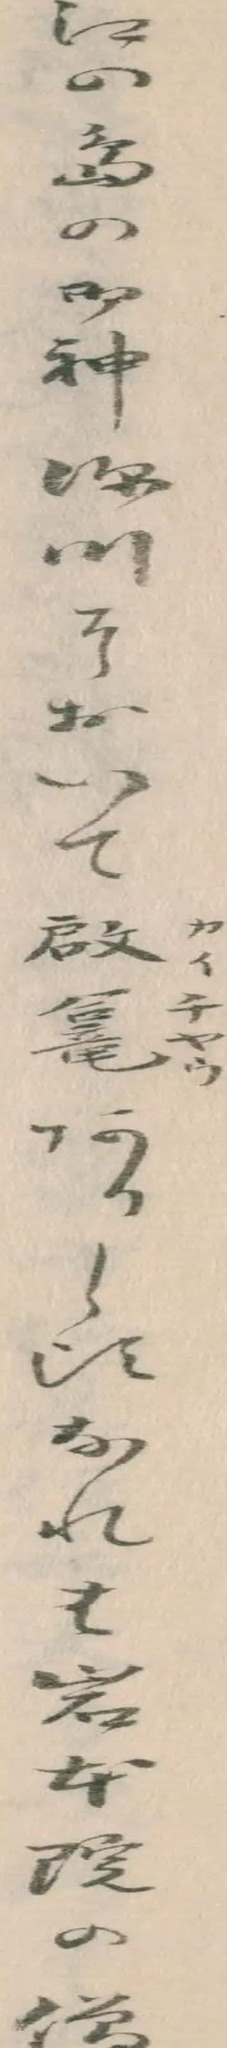江の島の御神深川において啓龕ありし頃なれは岩本院の僧
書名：地災撮要. 巻10(地震之部) 上,下
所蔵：国立国会図書館 National Diet Library, JAPAN
